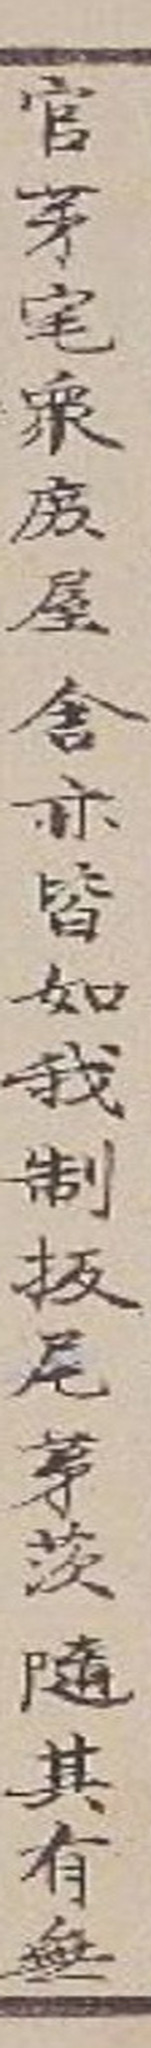官茅宅衆庶屋舍亦皆如我制板尾茅茨随其有無
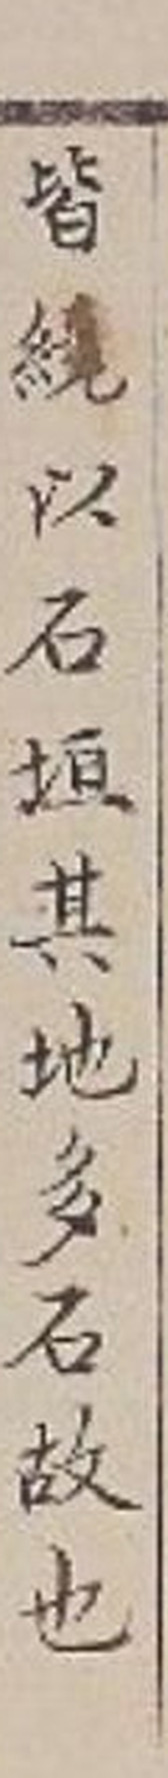皆繞以石垣其地多石故也
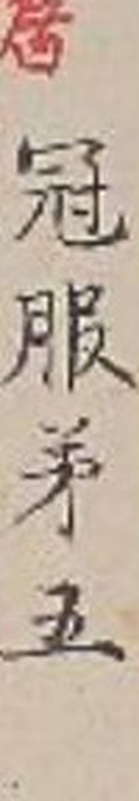冠服第五
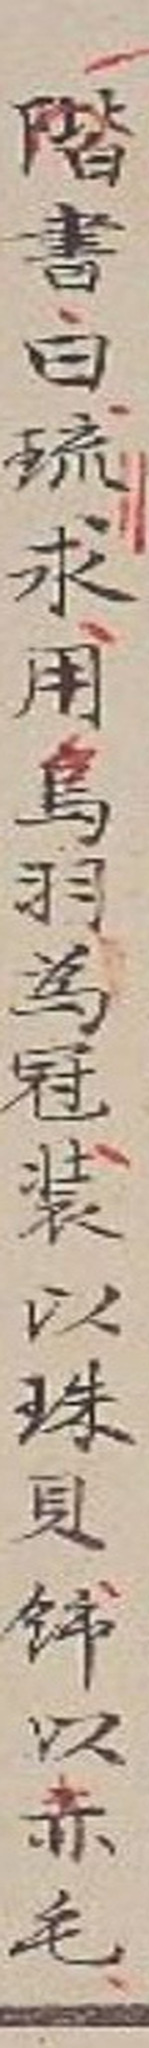階隋書、曰、琉求、用鳥羽為冠、装以珠貝、飾以赤毛、
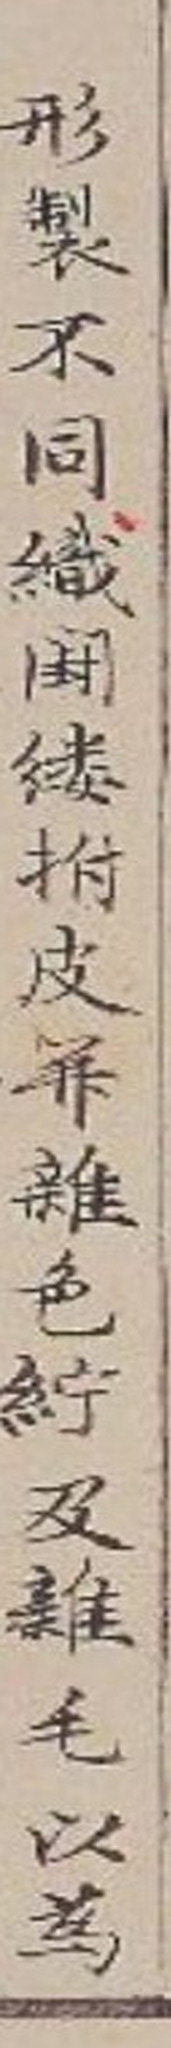形製不同、織縷拊皮并雑色紵及雑毛以為
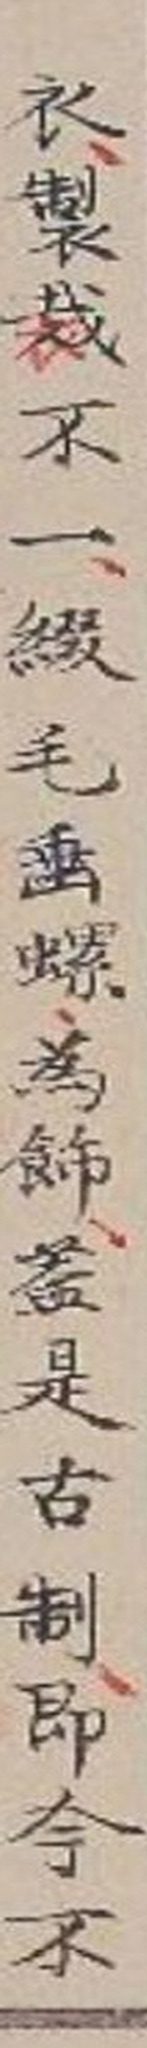衣、制裁不一、綴毛垂螺、為飾、蓋是古制、即今不

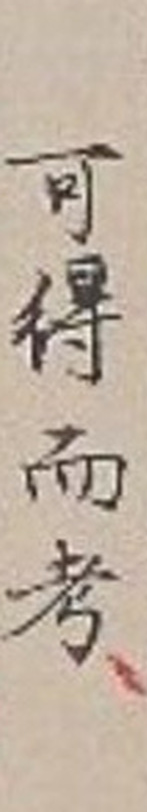可得而考、
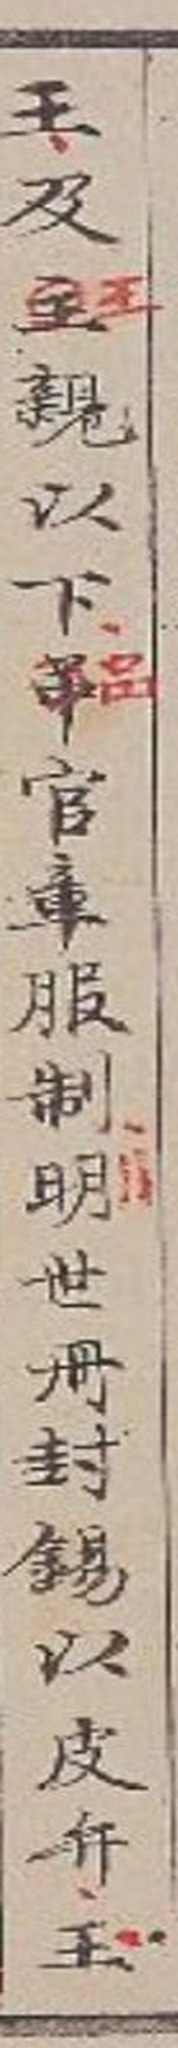王、及主王親以下、品官章服制、明世冊封錫以皮弁、王
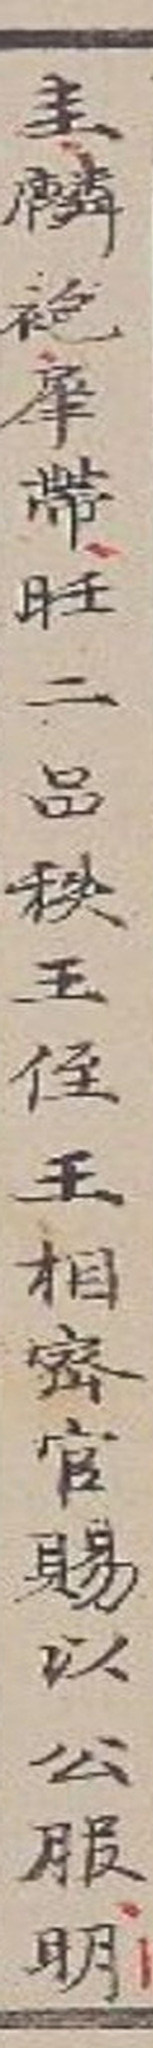圭、麟袍犀帯、䏕二品秩王侄王相密官賜以公服、明
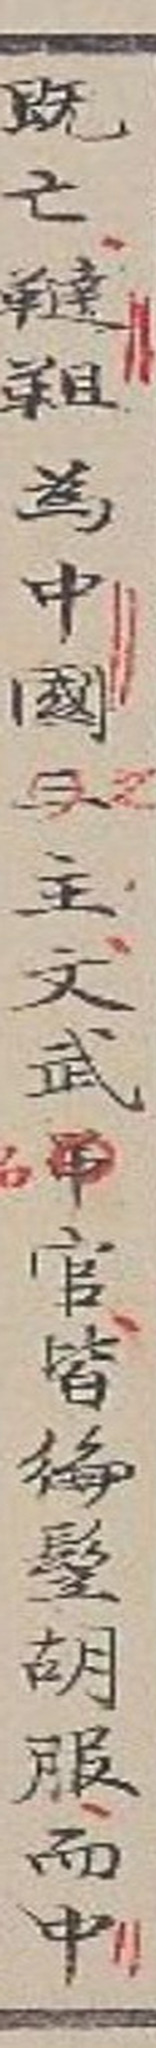既亡、靼靻為中国三之主、文武品官、皆編髪胡服、而中
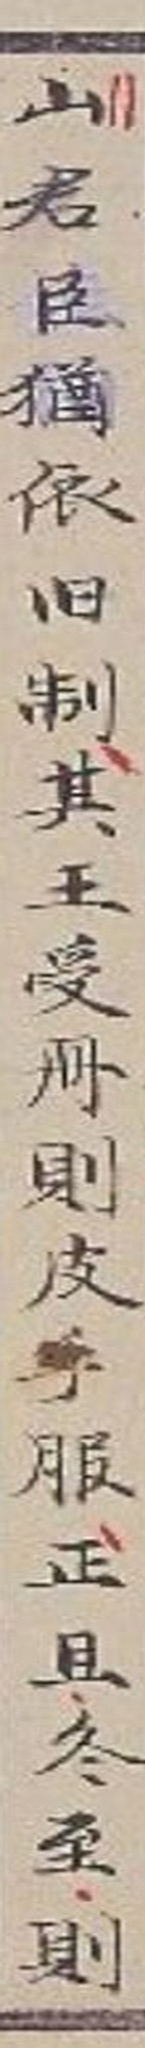山君臣猶依旧制、其王受冊則皮乎服、正旦、冬至、則
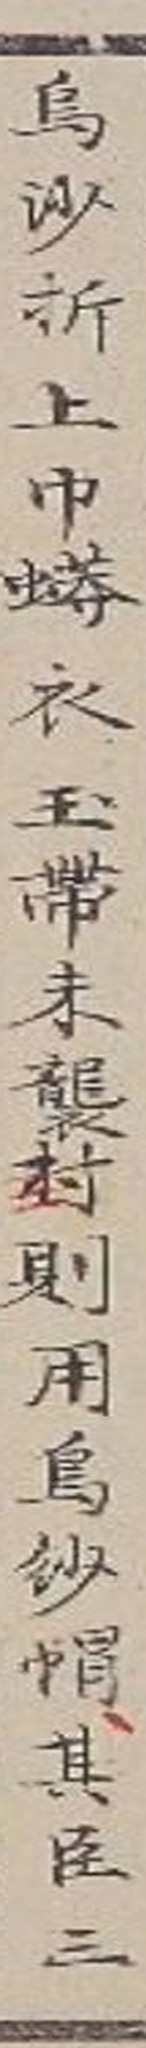鳥沙折上巾蟒衣玉帯未襲封則用鳥紗帽、其臣三
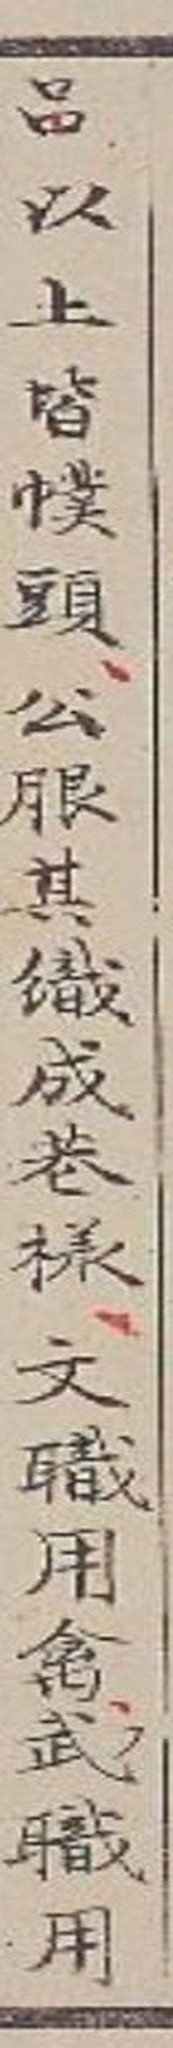品以上皆幞頭、公服其織成巷様、文職用禽、武職用
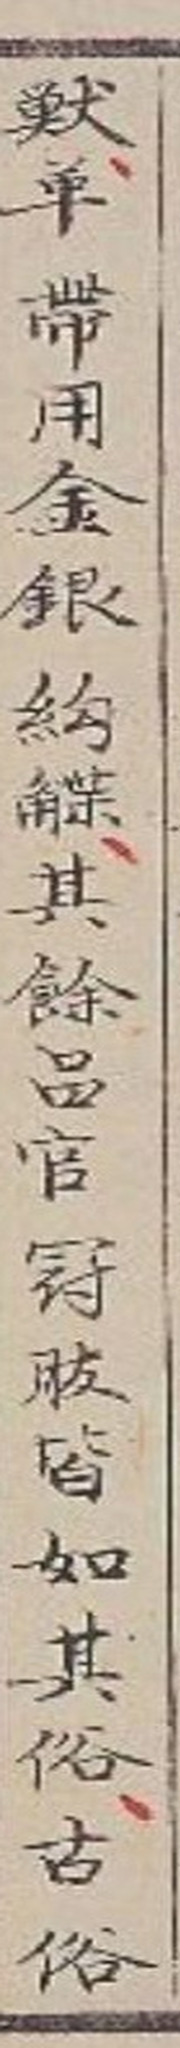獣、革帯用金銀絇䚢、其余品官冠服皆如其俗、古俗
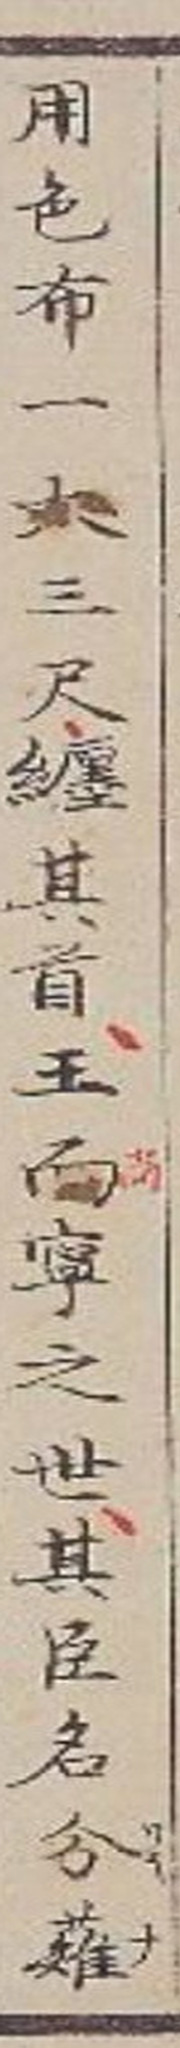用色布一丈三尺纏其首、王而尚寧之世、其臣名分薙
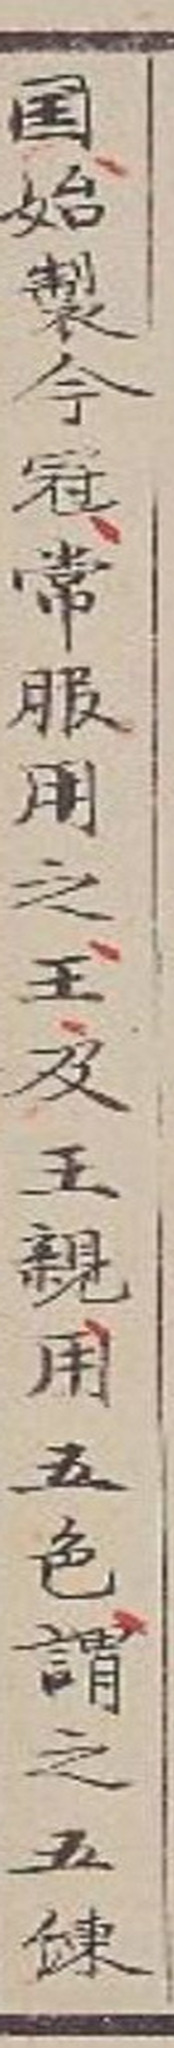国、始製今冠、常服用之、王、及王親用五色、謂之五練
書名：南島志 全
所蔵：University of the Ryukyus Library
